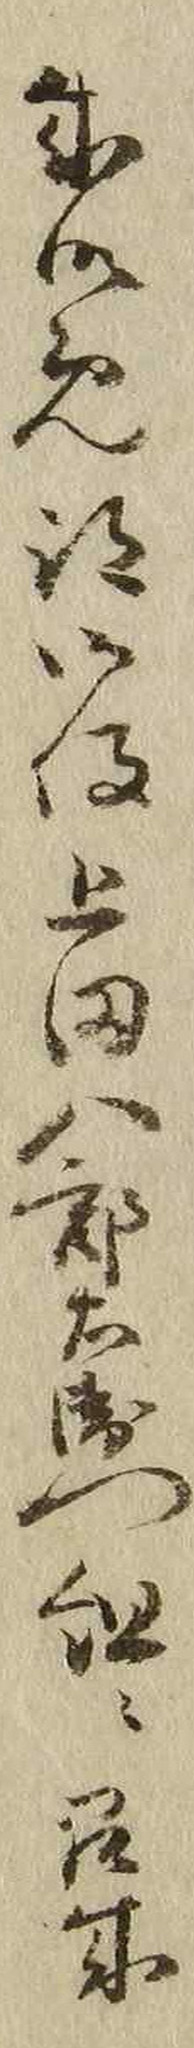成御免跡御役上田八郎右衛門組ニ罷成
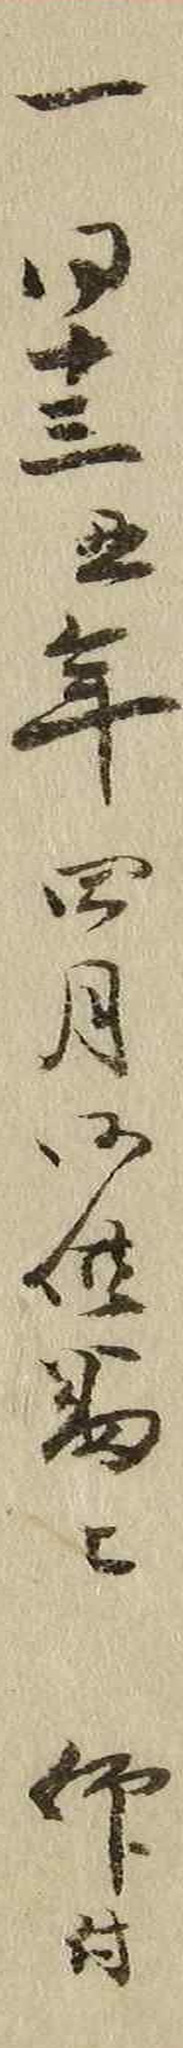一同十三丑年四月御供番被仰付
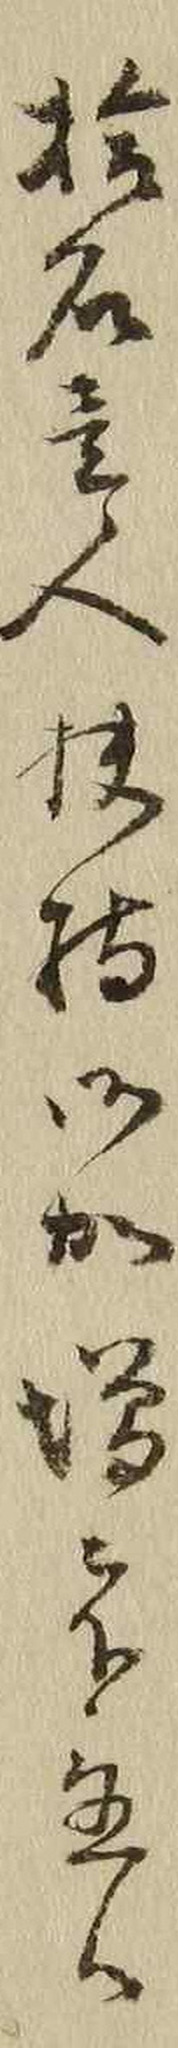拾石壱人扶持御加増被下置候
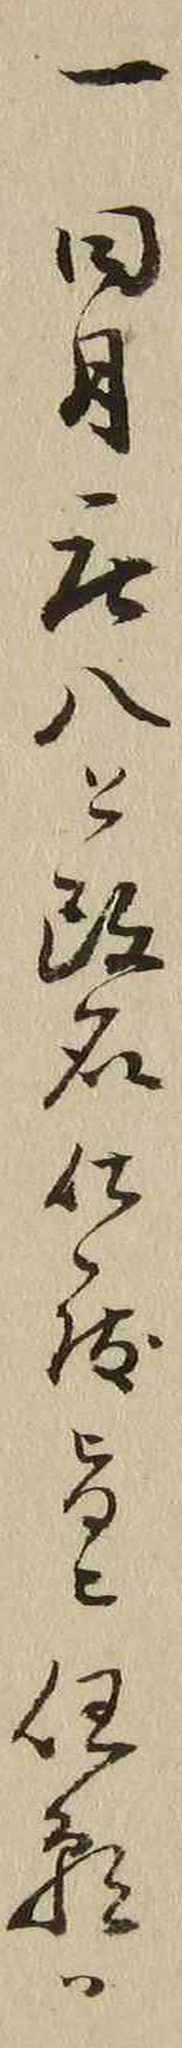一同月庄八と改名仕度旨被任願候
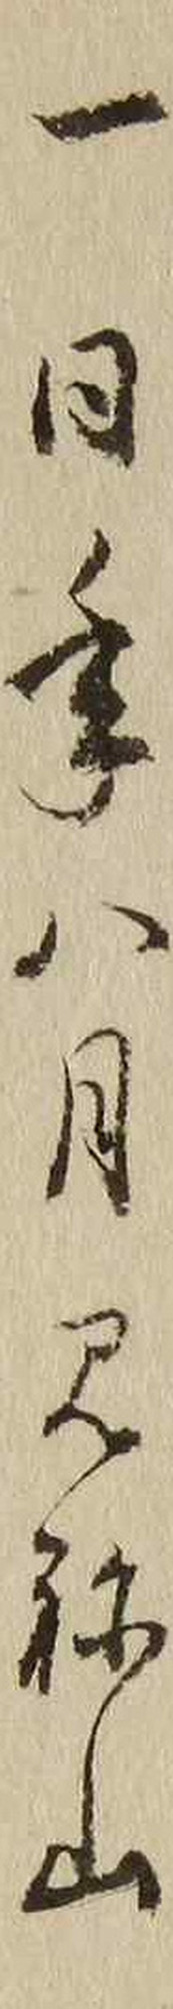一同年八月見禰山
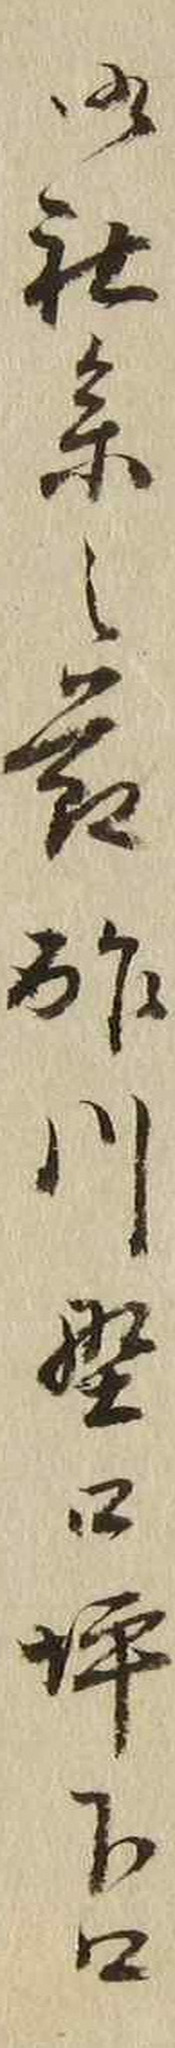御社参之節酢川野口坪下口
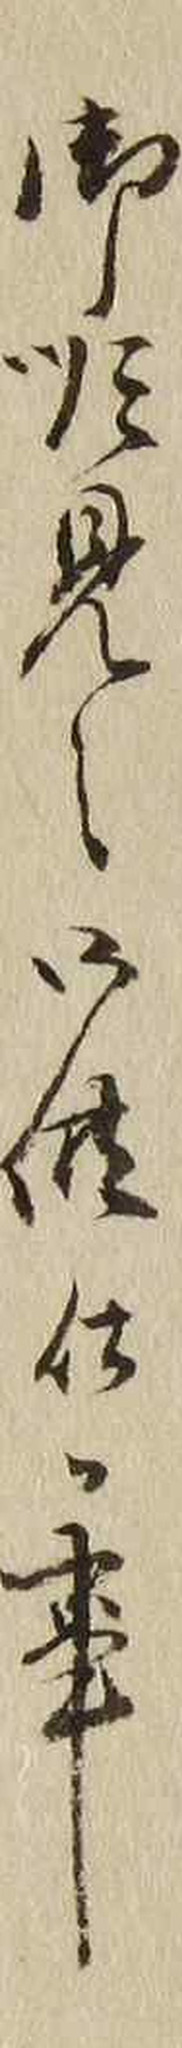御順見之御供仕候事
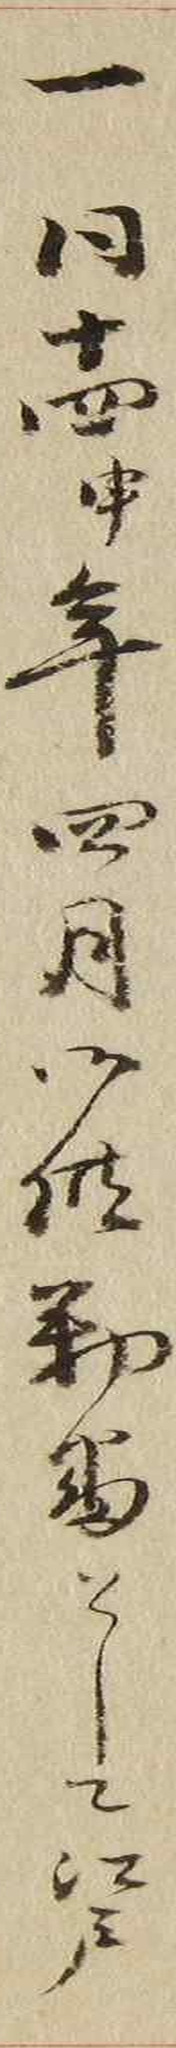一同十四申年四月御供勤番として江戸
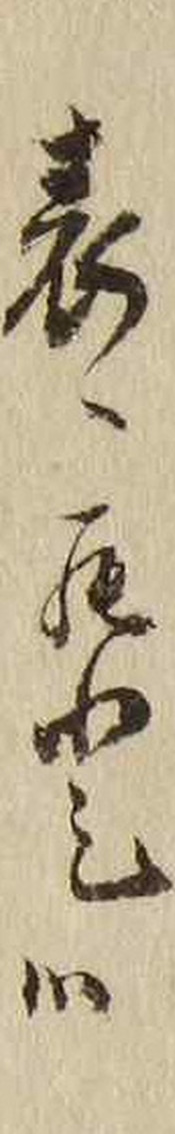表へ罷登候
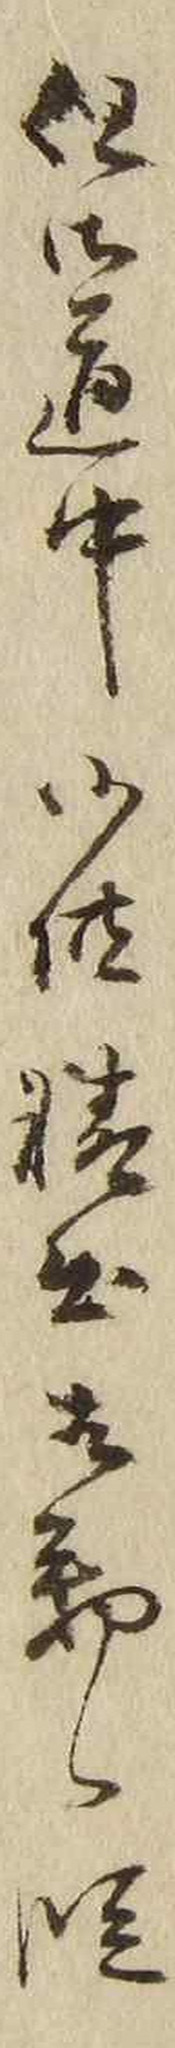但御道中御供精出相勤候段

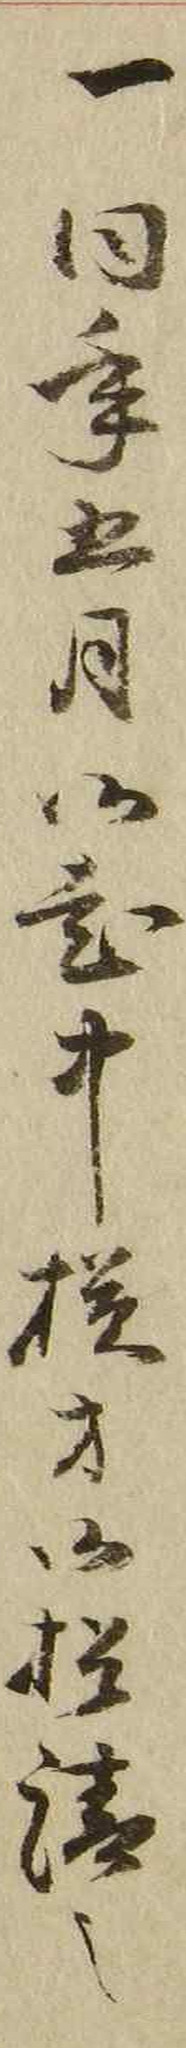一同年五月御老中様方御招請之
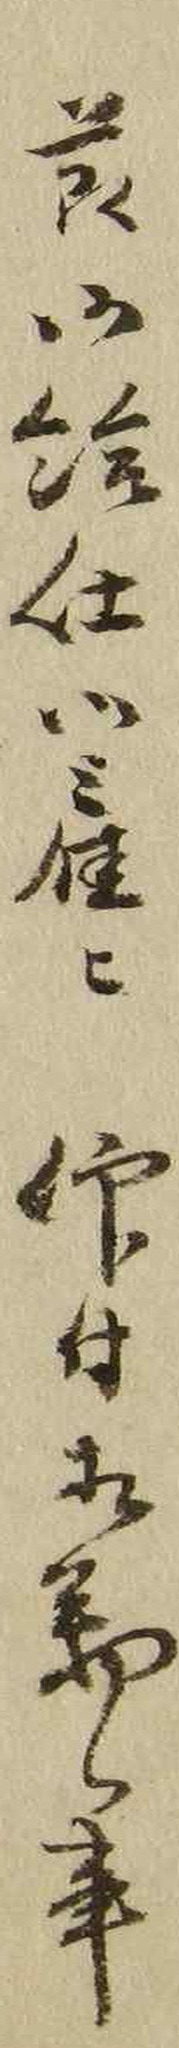節御給仕御雇被仰付相勤候事
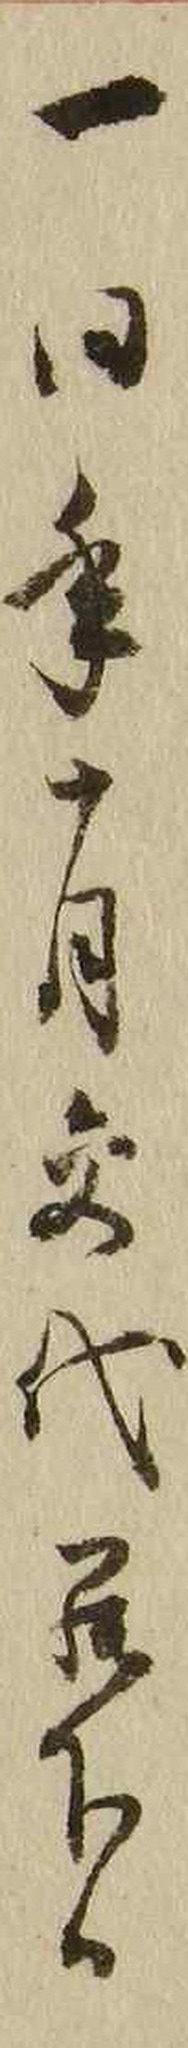一同年十月交代罷召下候
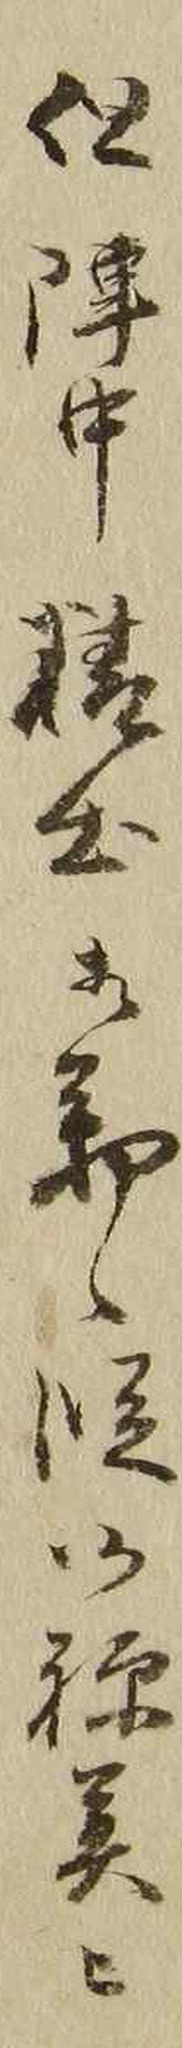但陣中精出相勤候段御称美被
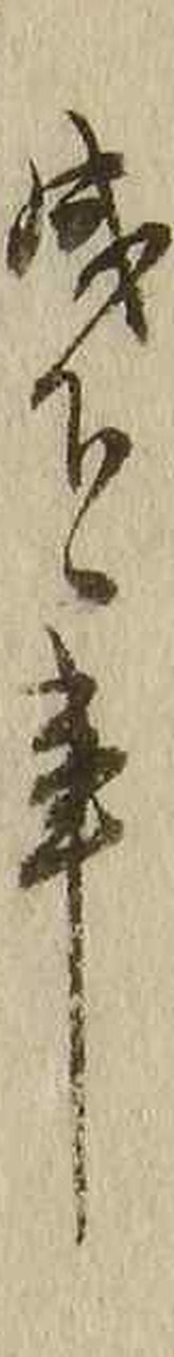成下候事
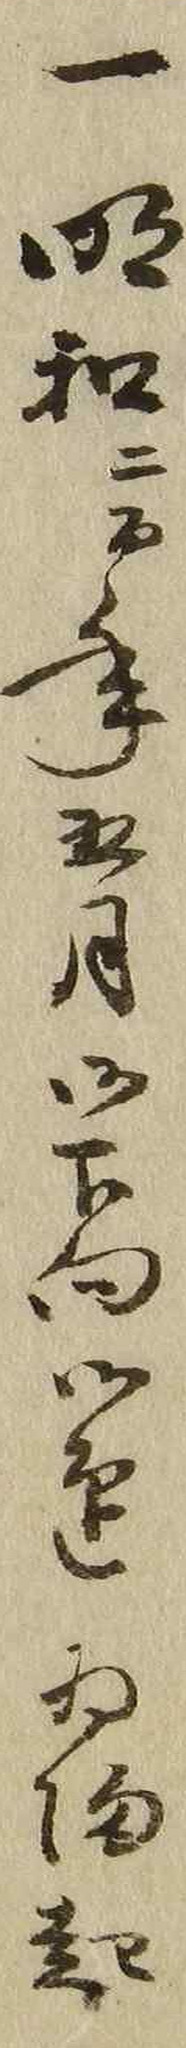一明和二酉年五月御下向御迎為帰起
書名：諸士系譜　巻之232　け之部1
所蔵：会津若松市立会津図書館
